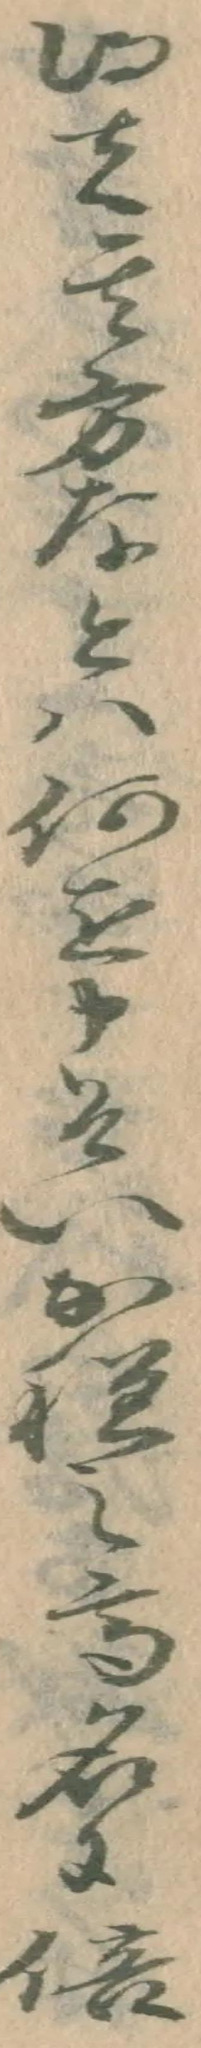得者其方なとは何を申そいか程之高名尓倍
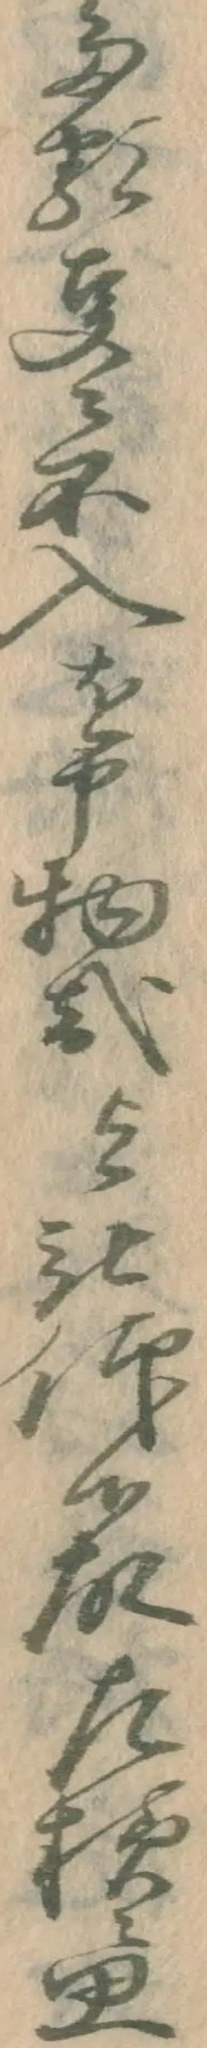多類事に不入を申物哉与被仰候故左様に思
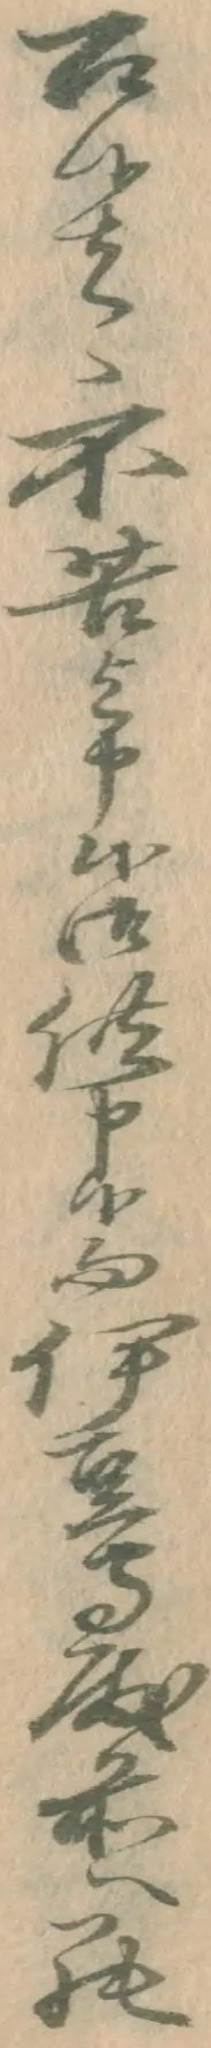召候者々不苦与申候御供申候而伊豆守殿前へ罷

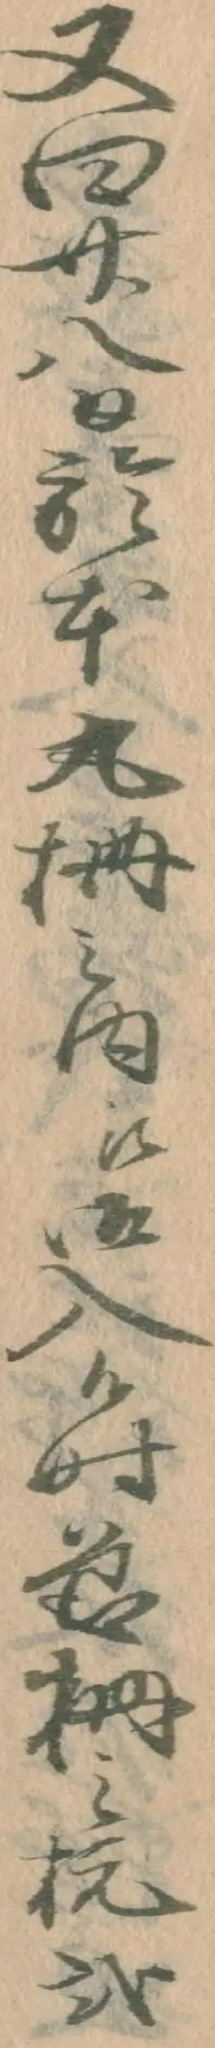又曰廿八日於本丸柵之内江御入候時節柵之杭弐
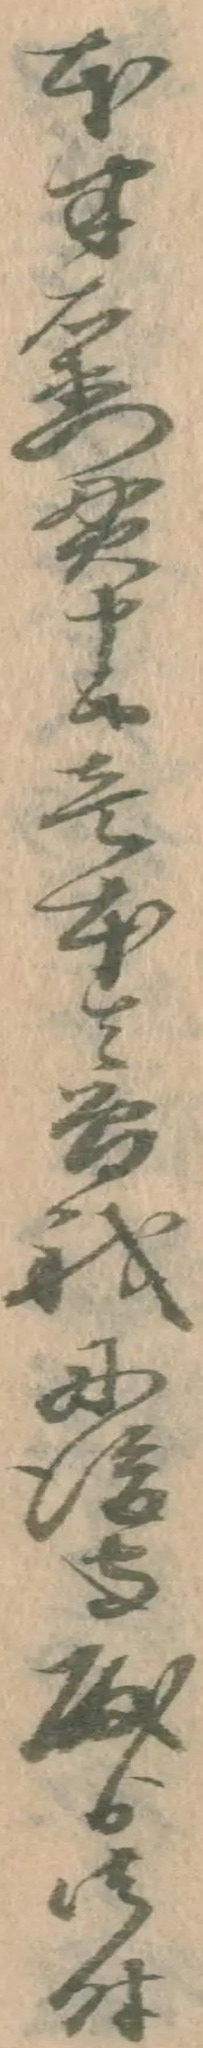本半右衛門貫申候壱本者曽我丹後守殿ゟ御付
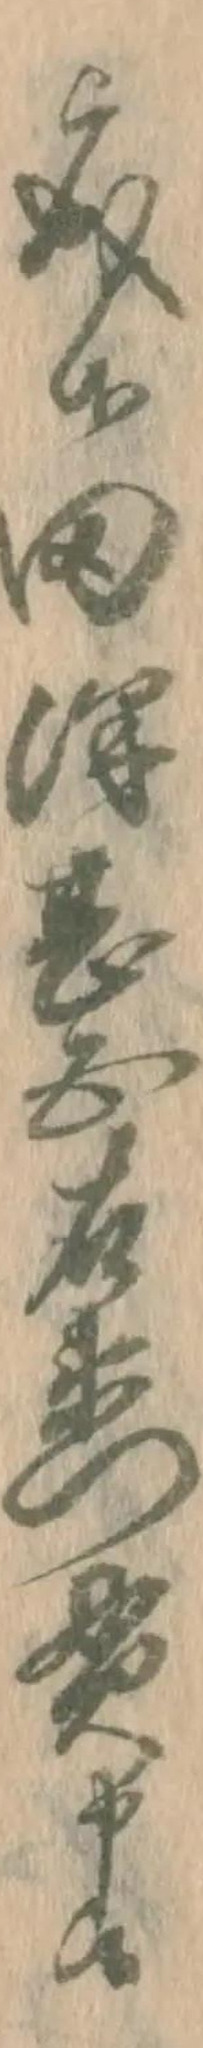被成候田沢甚五右衛門貫申候
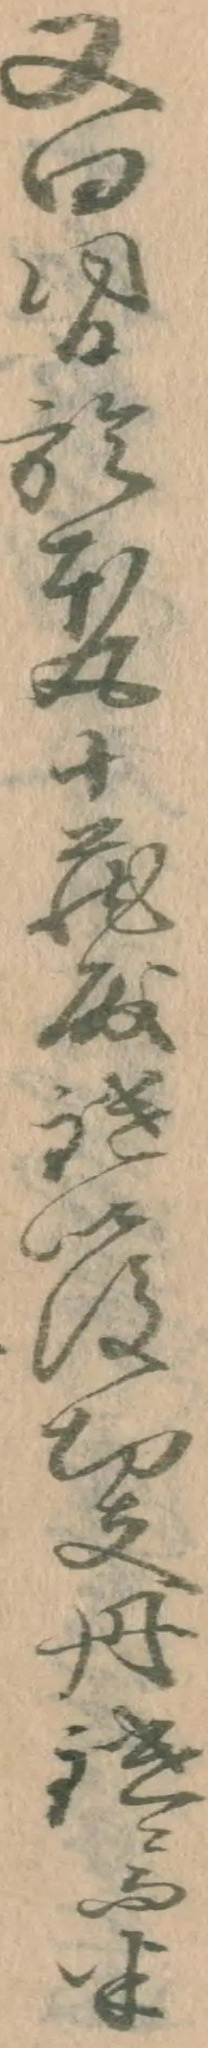又曰同日於本丸十蔵殿鑓以役切支丹鑓に而半
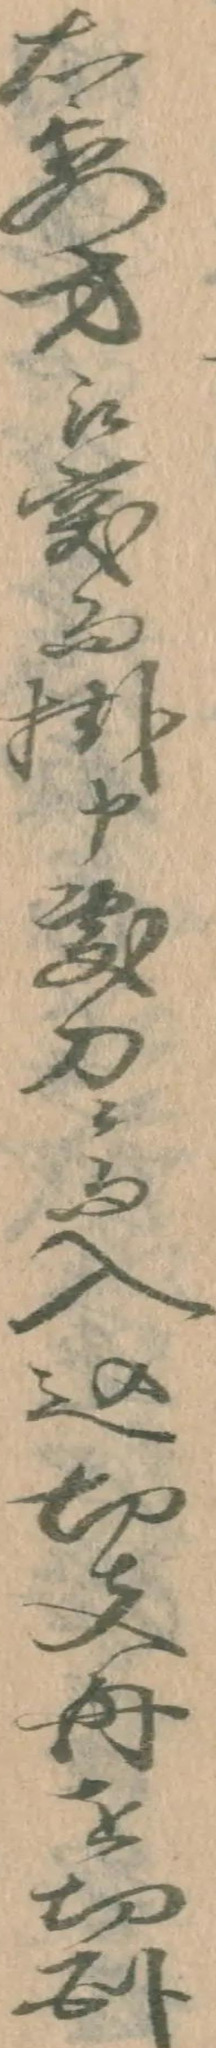右衛門方江突而掛申處刀に而入込切支丹を切臥
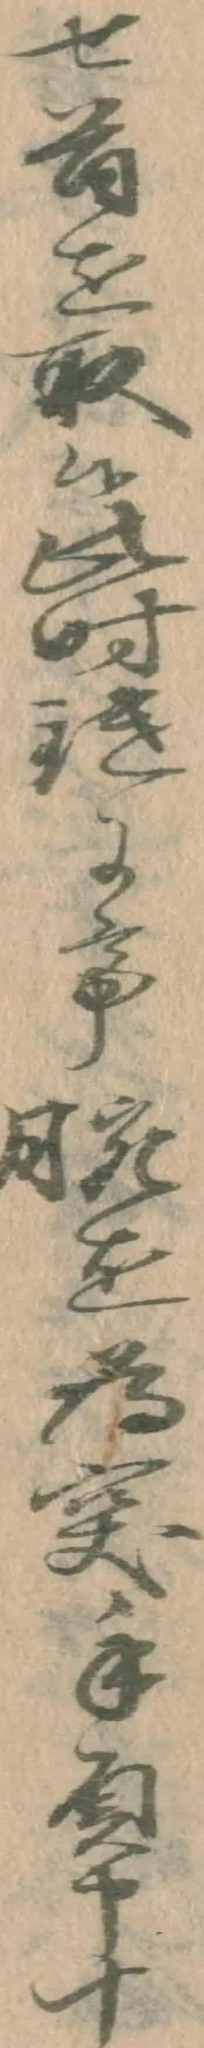せ首を取候此時鑓尓亭腕を為突手負申十
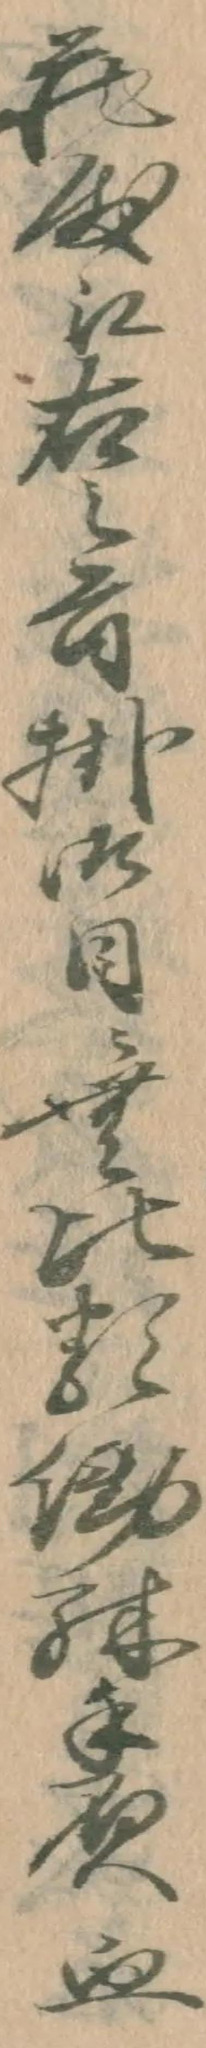蔵殿江右之首掛御目に無比類働殊手負血
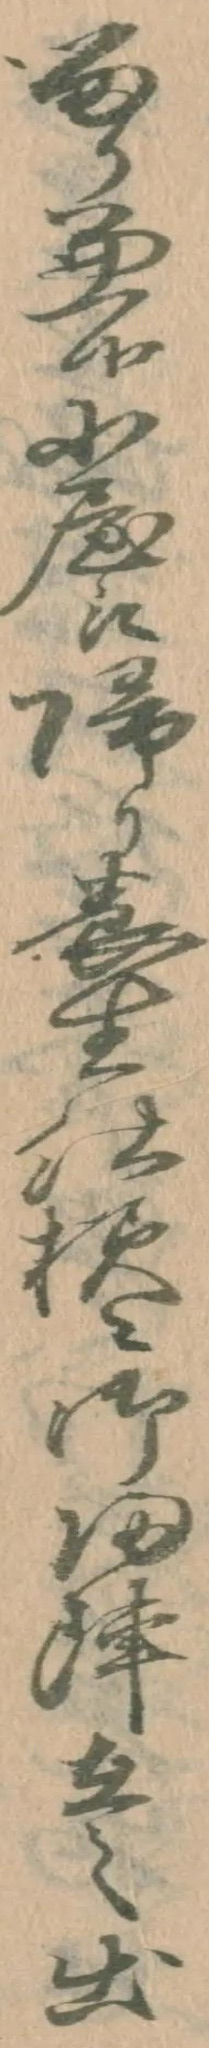留り兼候小屋江帰り養生仕様に御帰陣在之出
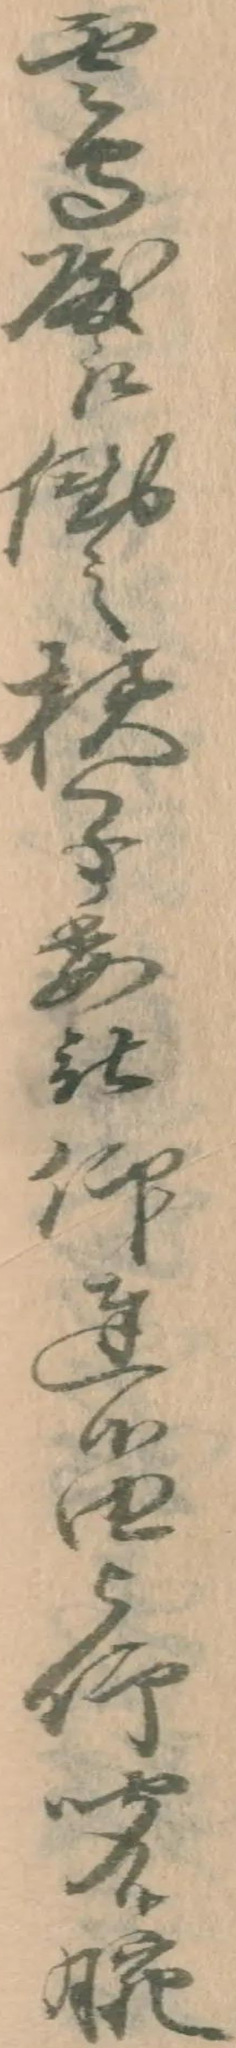雲守殿江働之様子委被仰達候由被仰聞候腕
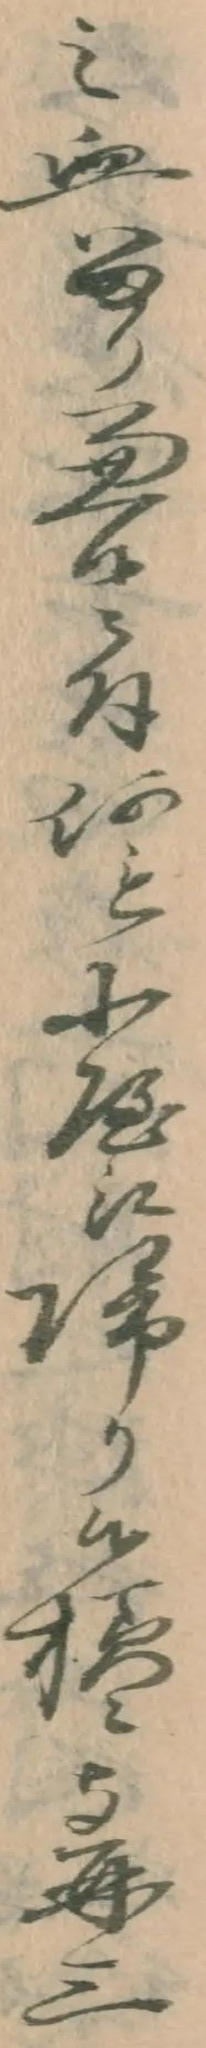之血留り兼候に付何も小屋江帰り候様に与再三
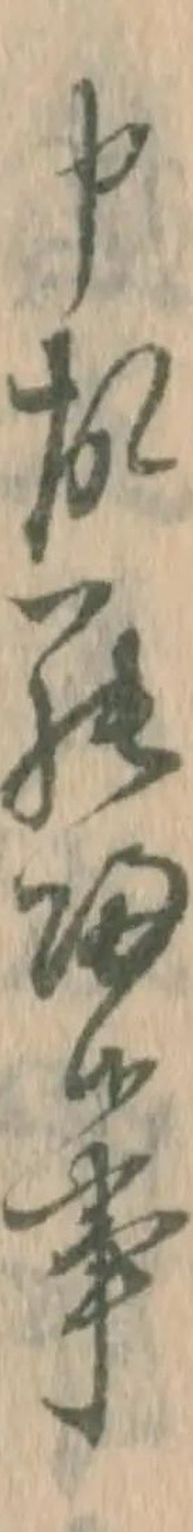申故罷帰候事
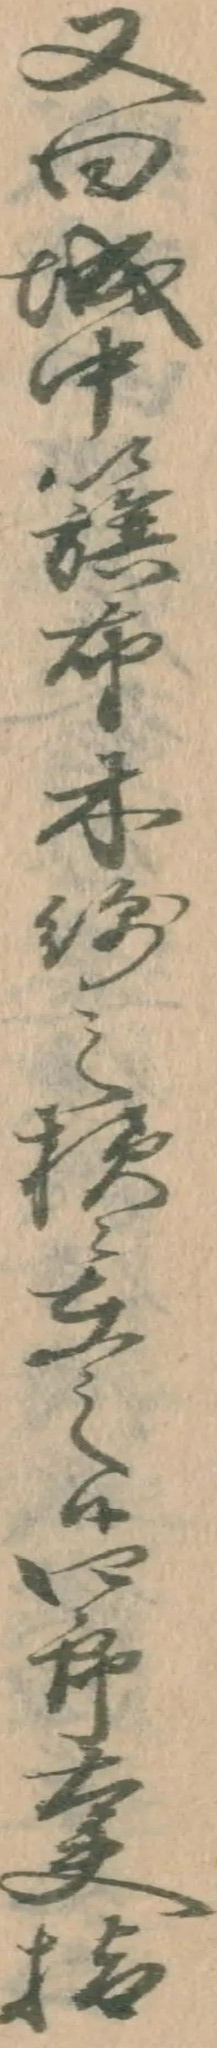又曰城中籏布木綿之様に在之候四郎太夫指
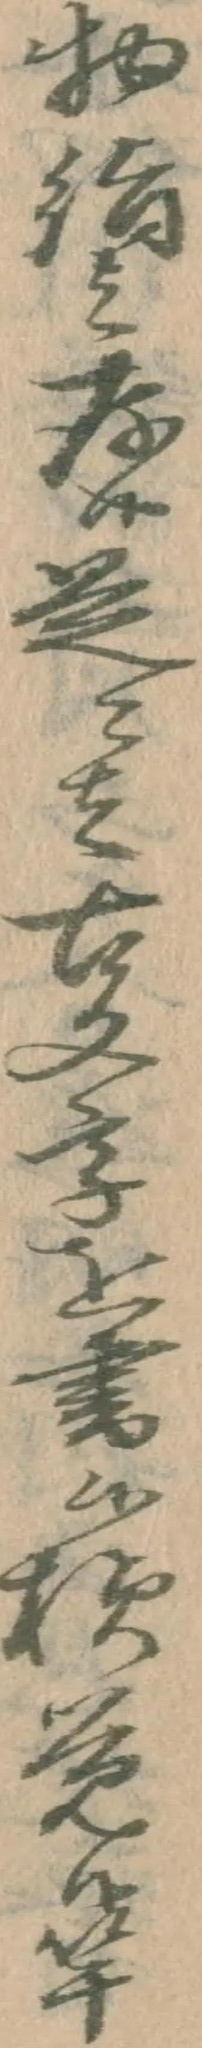物絹与存候是に者古文字を書候様覚候竿
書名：切支丹御退治記 49巻. [8]
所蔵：国立国会図書館 National Diet Library, JAPAN
